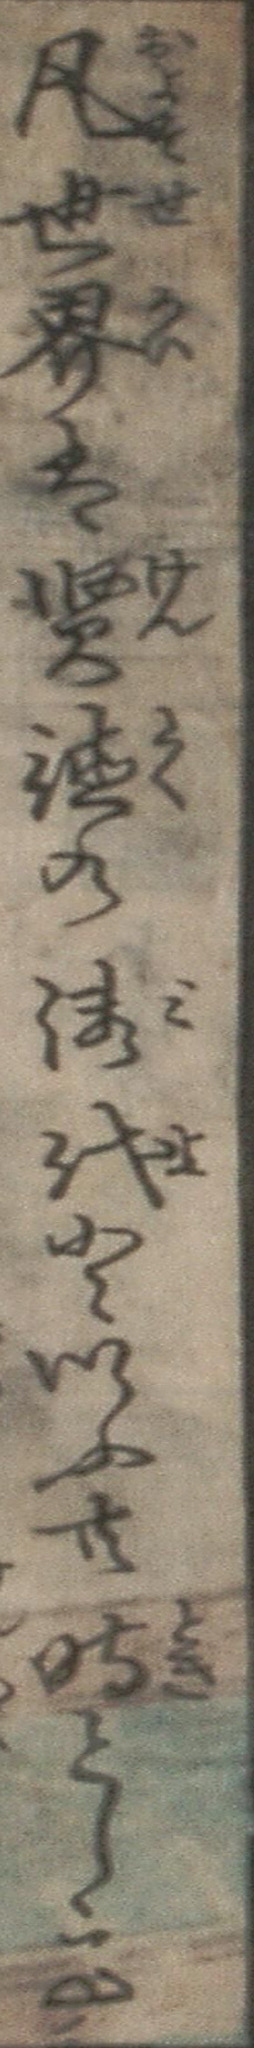凡世界は賢徳の御代といふ共時として
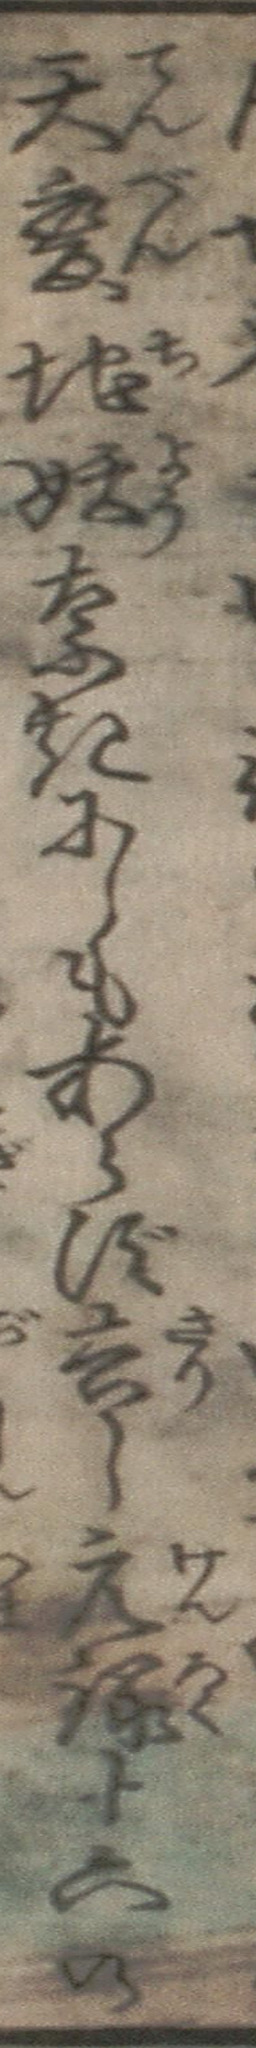天変地妖なきにしもあらず去し元禄十六の
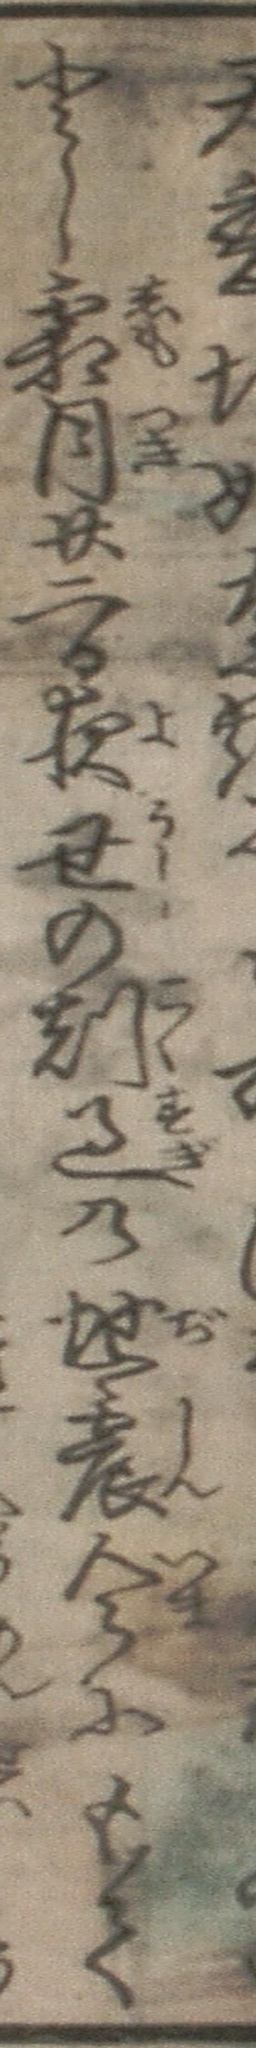とし霜月廿二日夜丑の刻過の地震今にもて
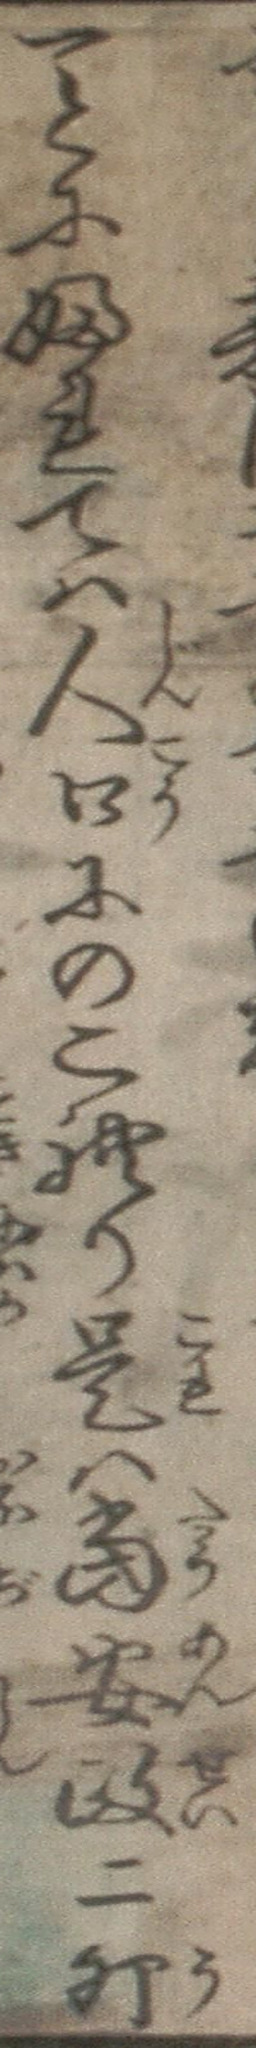ことにふれては人口にのこれり是は當安政二卬
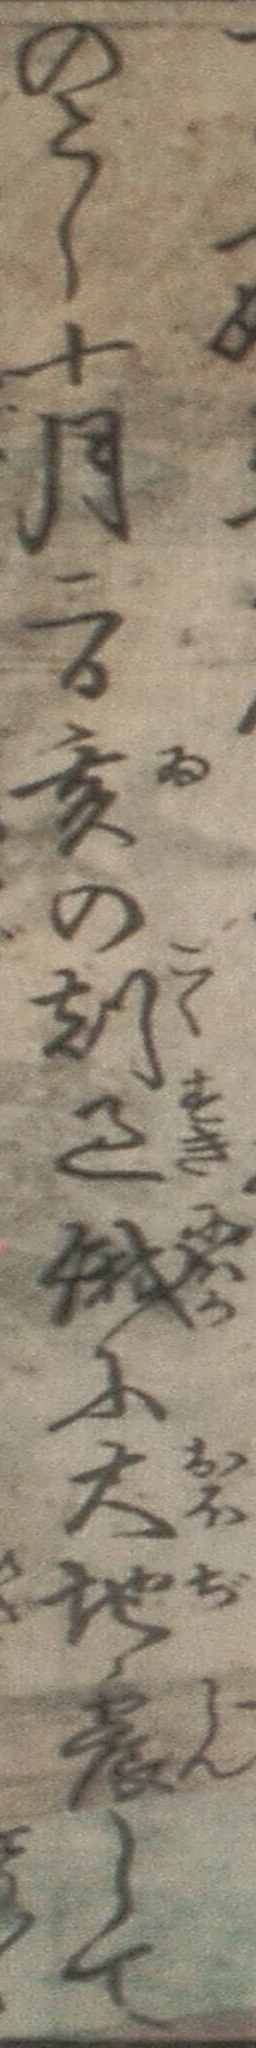のとし十月二日亥の刻過俄に大地震して
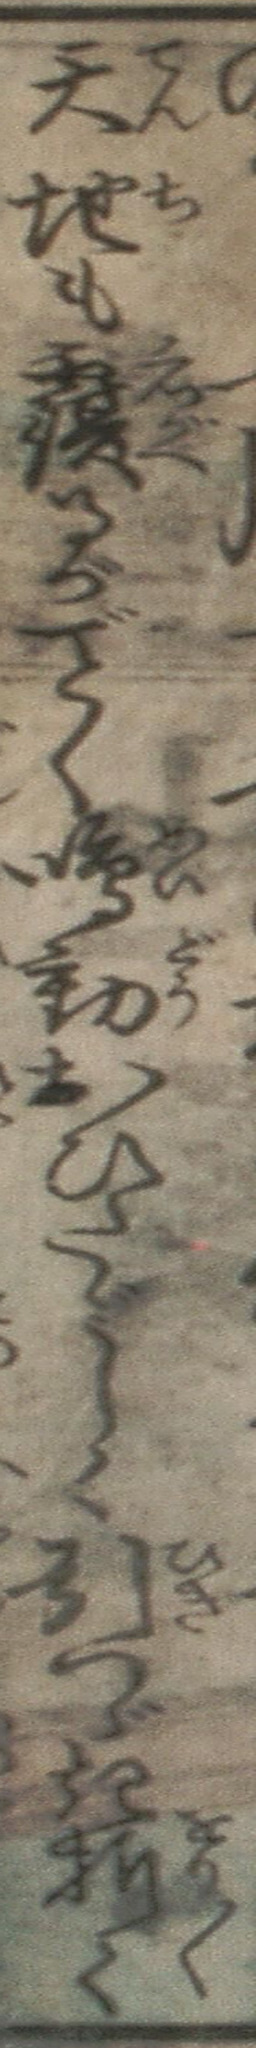天地も覆るがごとく鳴動おひたゞしく引つゞき折〳〵
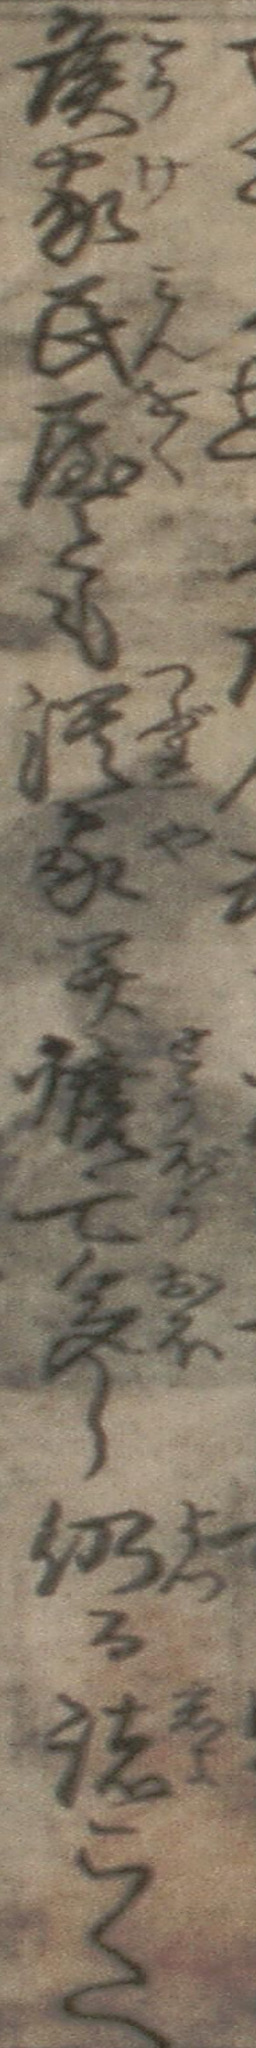侯家民屋とも潰家并焼亡多し仍而諸こくへ
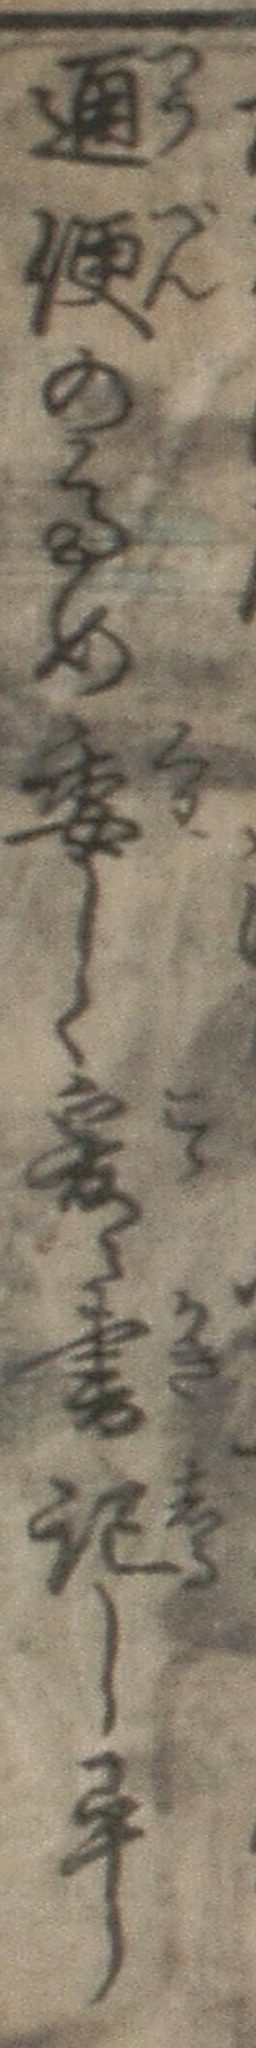通便のため委しく爰に書記し乎

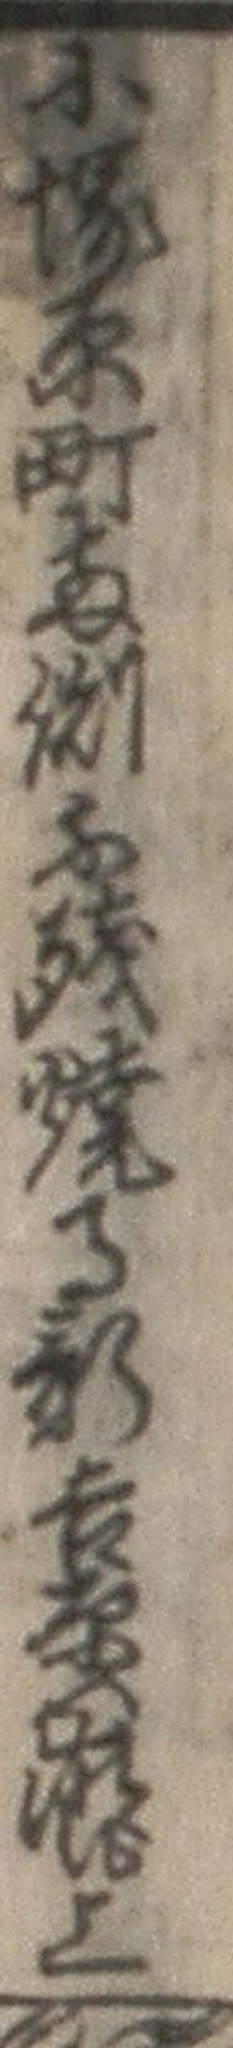小塚原町両側不残焼る新吉原は崩候上
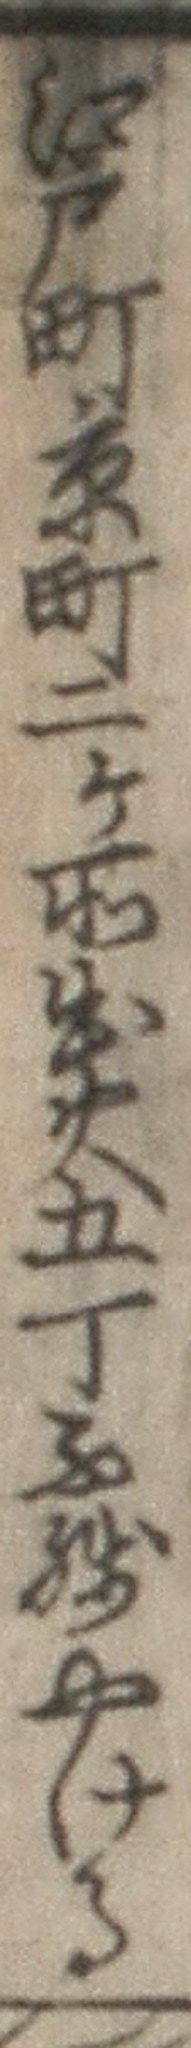江戸町京町二ヶ所出火五丁不残やける
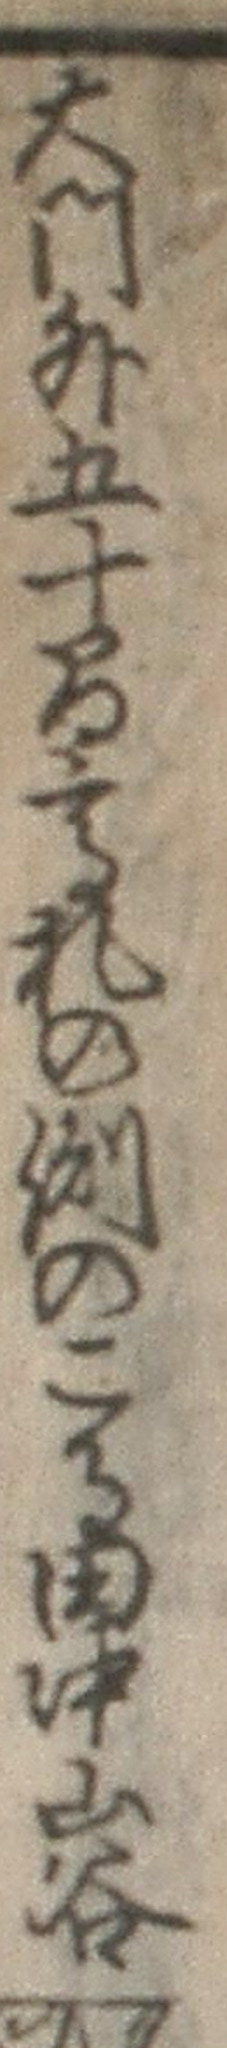大門外五十間高札の側のこる田中山谷
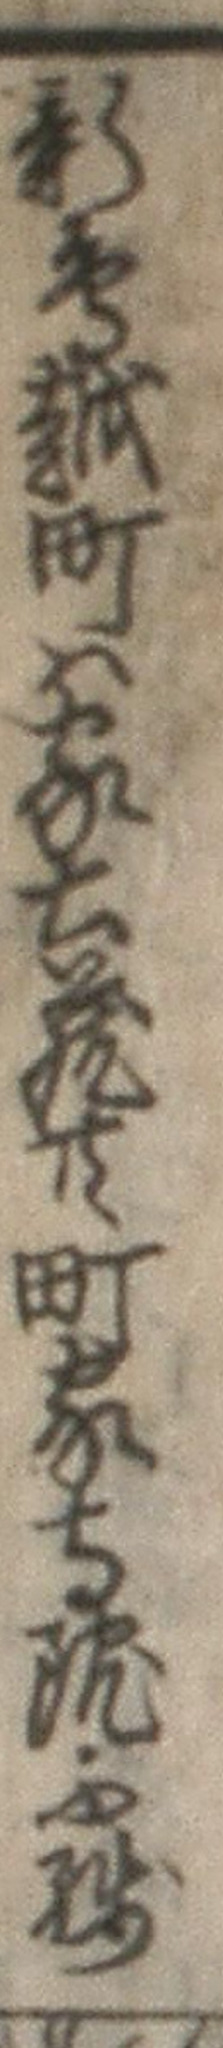新鳥越町は家土蔵共町家寺院不残
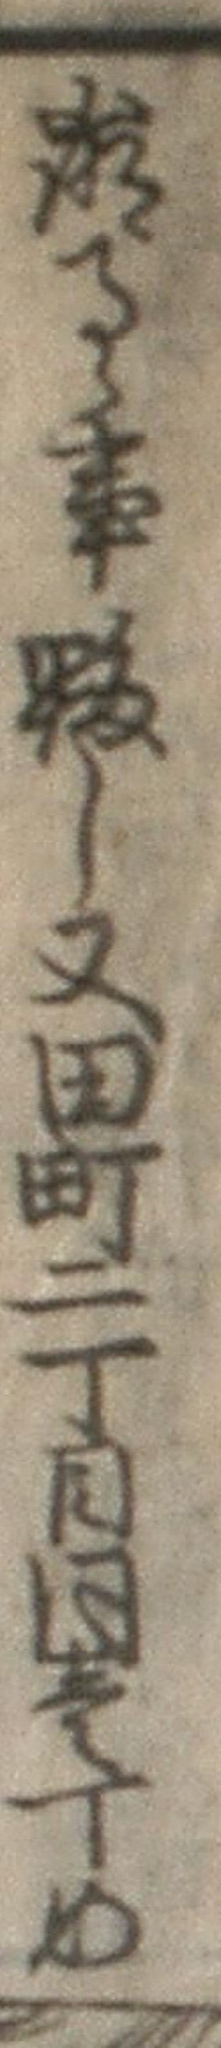崩るヽ事夥し又田町二丁目同壱丁め
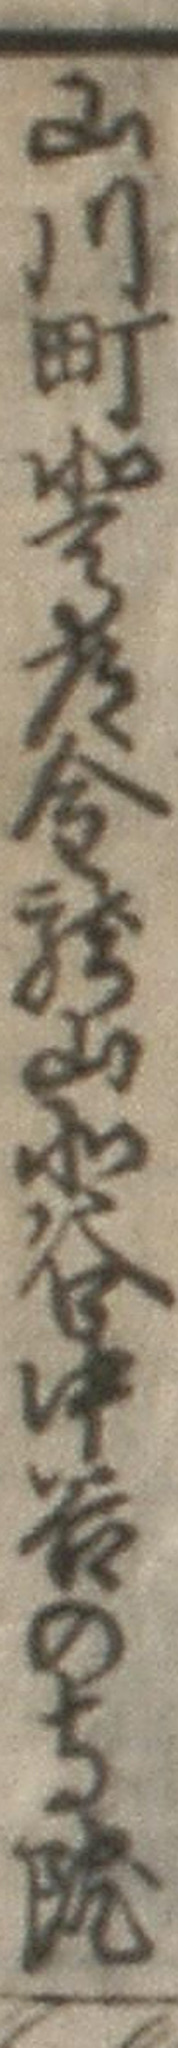山川町北馬道金龍山北谷中谷の寺院
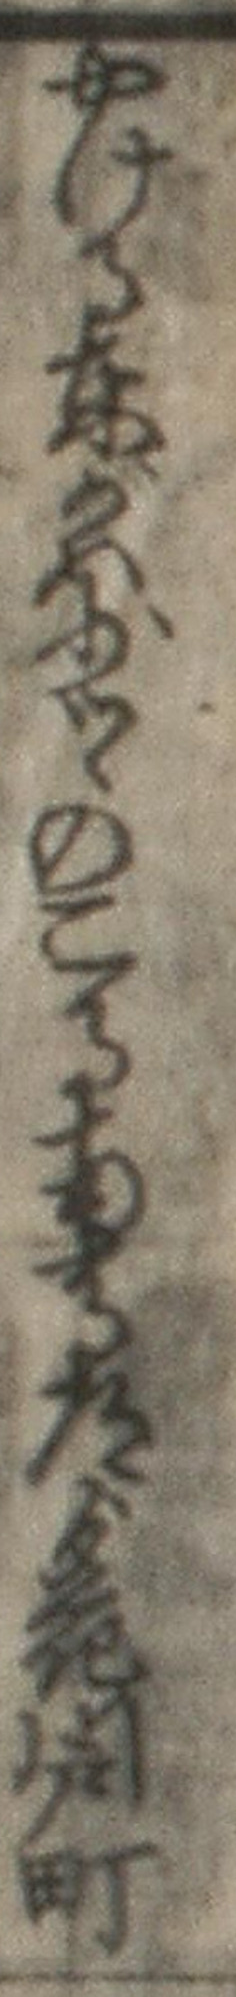やける東かは少ツゝのこる南馬道ゟ花川戸町

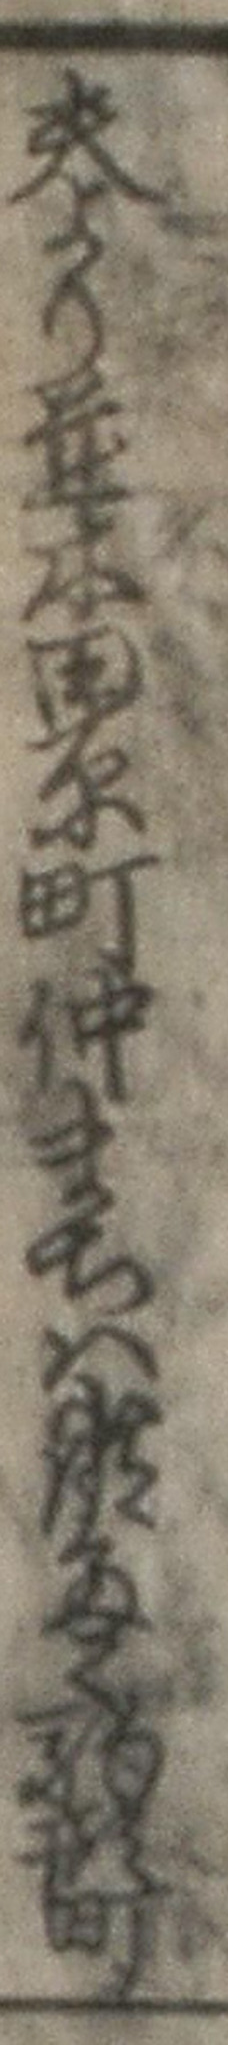夫より並木田原町仲まちは崩多く駒形町
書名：江戸大地震末代鑑
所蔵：東京大学地震研究所図書室 Earthquake Research Institute Library, The University of Tokyo, JAPAN
